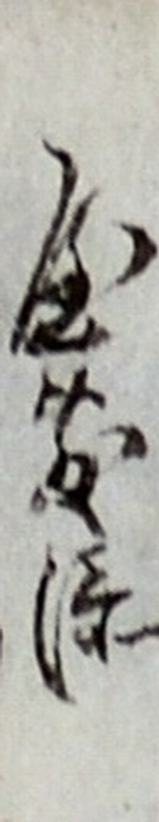屋敷添
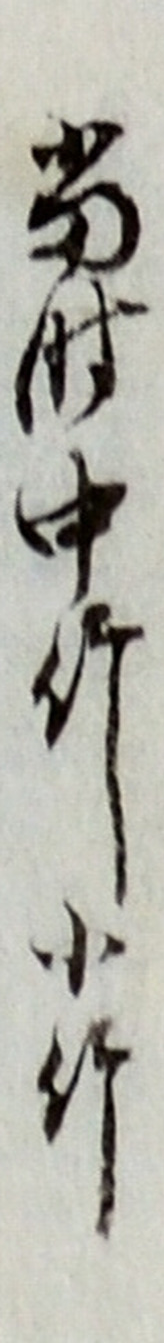当時中竹小竹

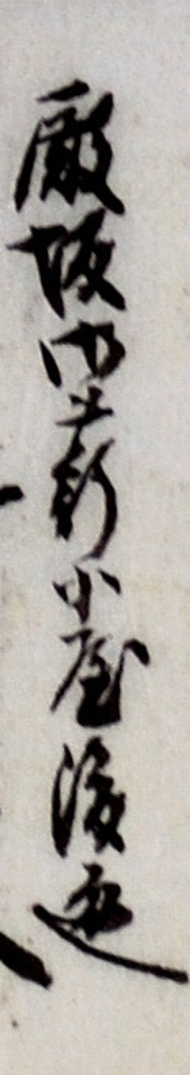殿坂御薪小屋後通
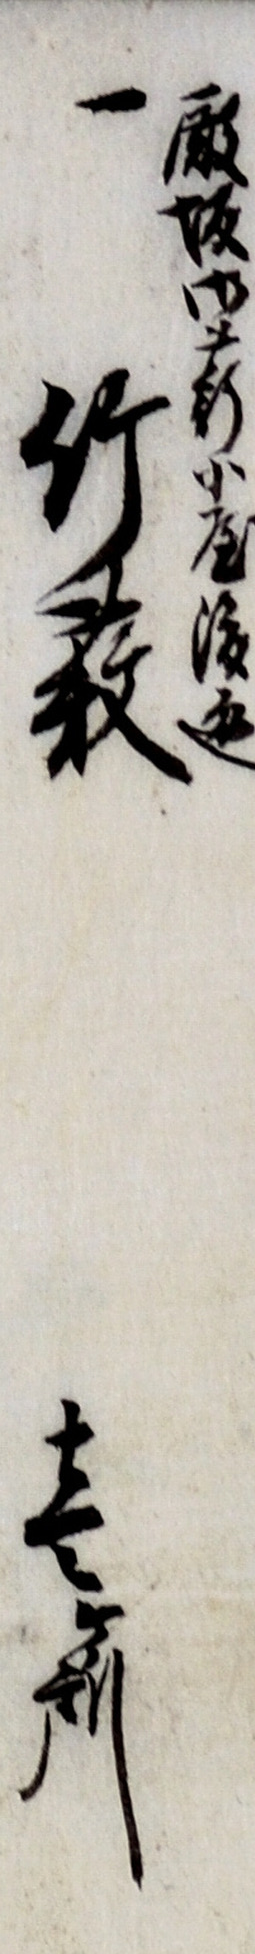一竹藪壱ケ所
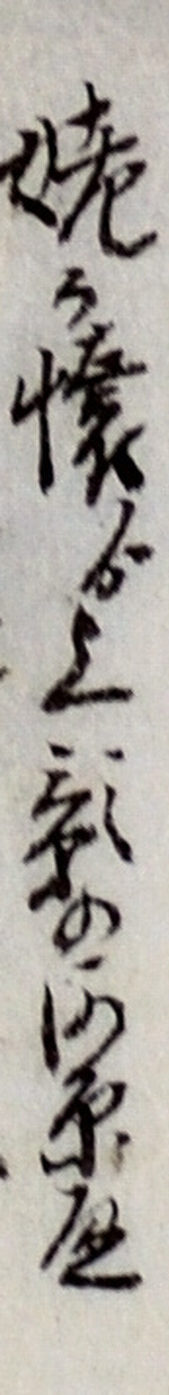姥ケ懐ゟ上影の河原通
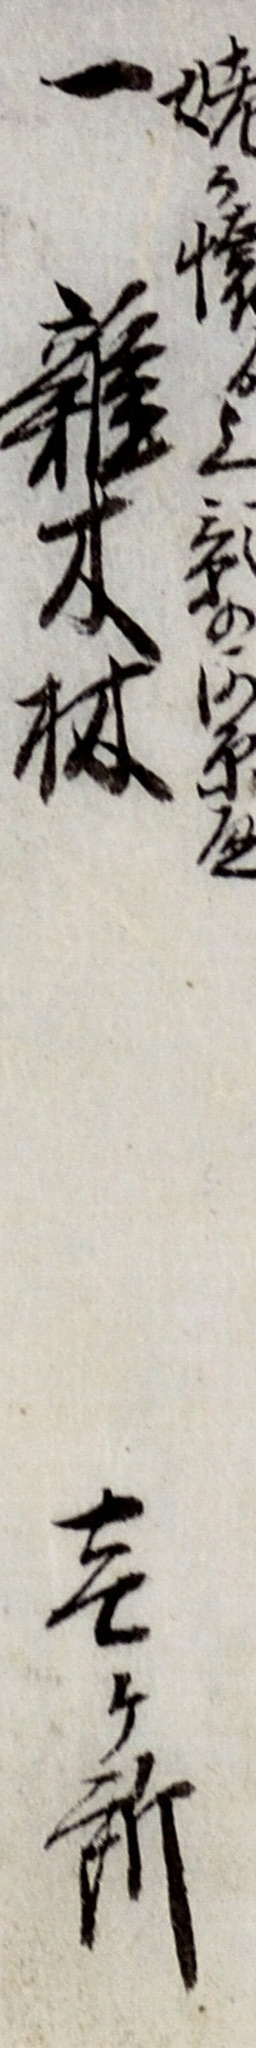一雑木林壱ケ所
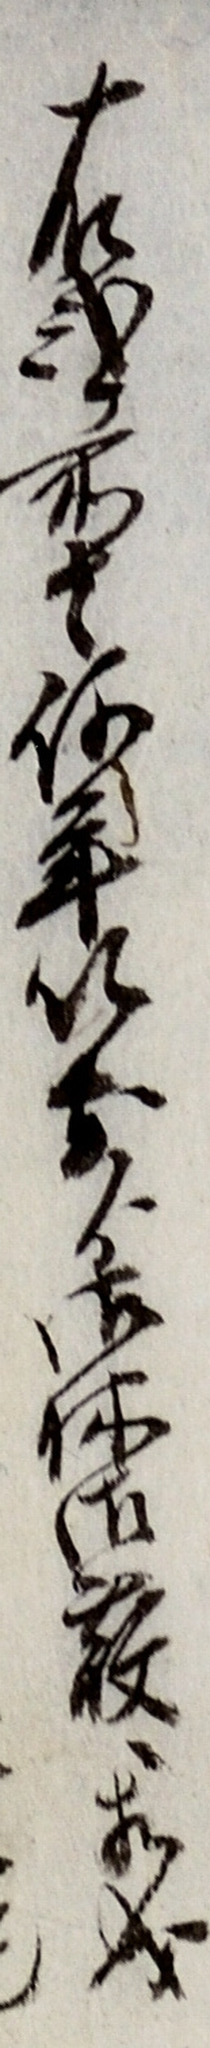右弐ケ所者何年以前ゟ御休御薮へ相成
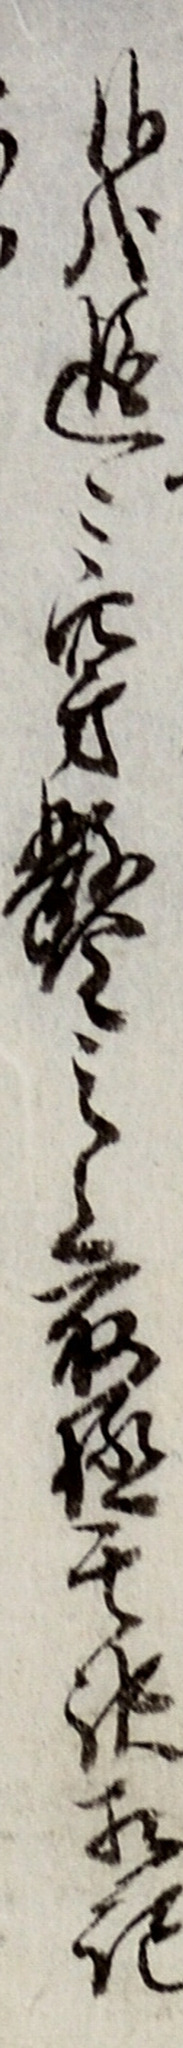候哉追々穿鑿之上取極其訳相記
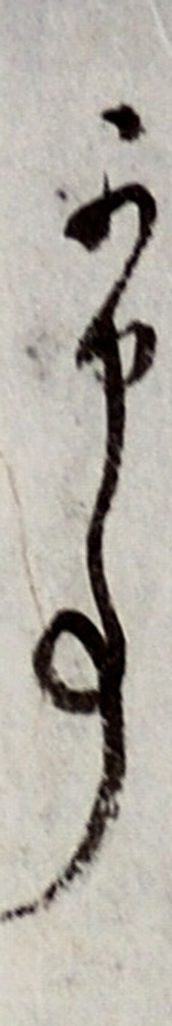可申事
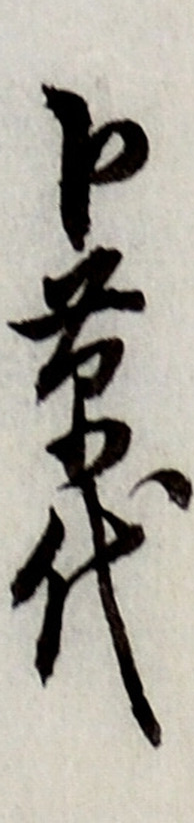下草代
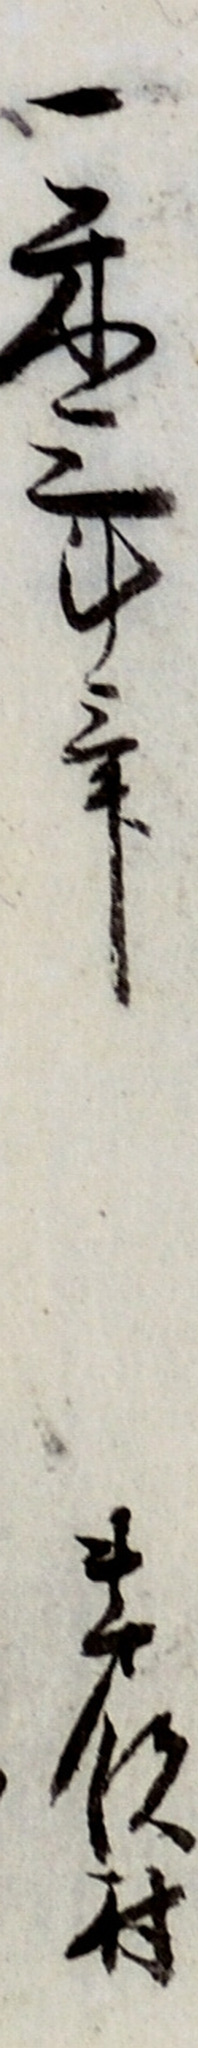一米三斗三升芦沢村
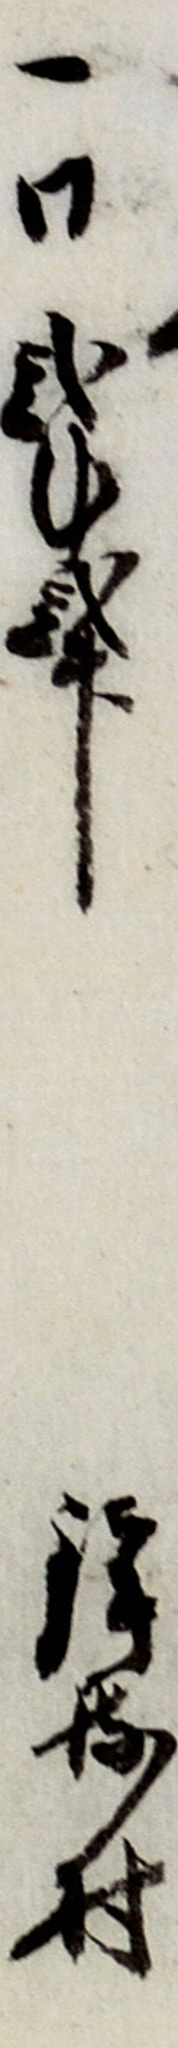一同弐斗弐升鉾持村
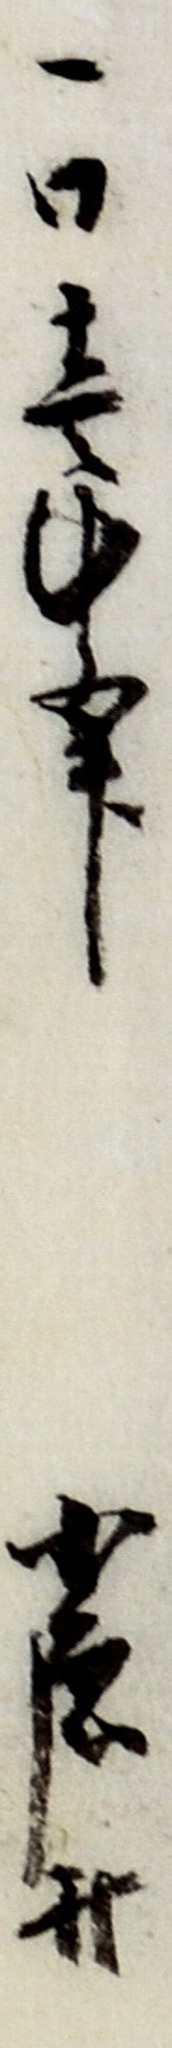一同壱斗五升小原村
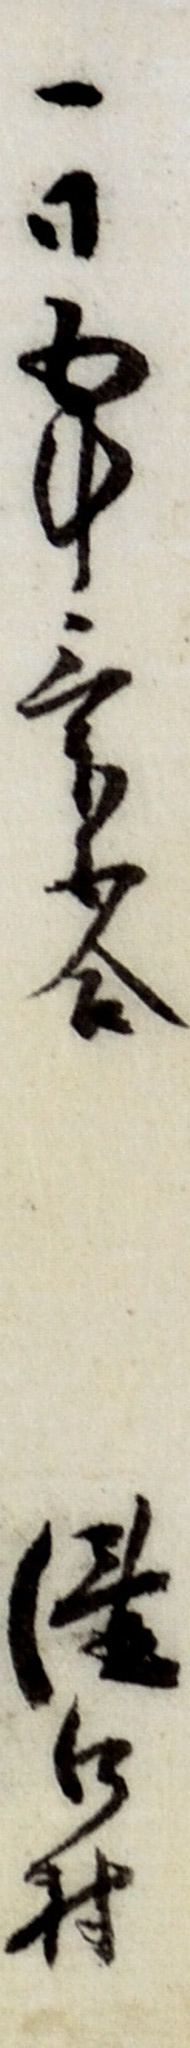一同五斗三升五合溝口村
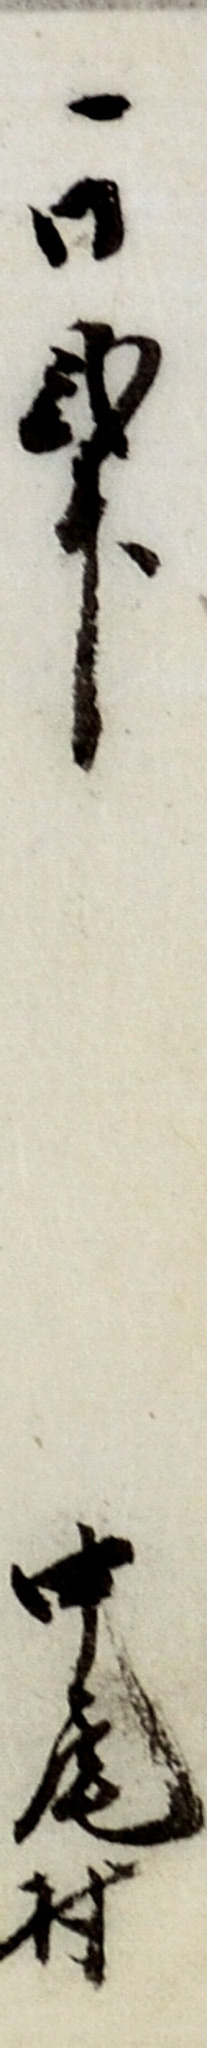一同弐升中尾村
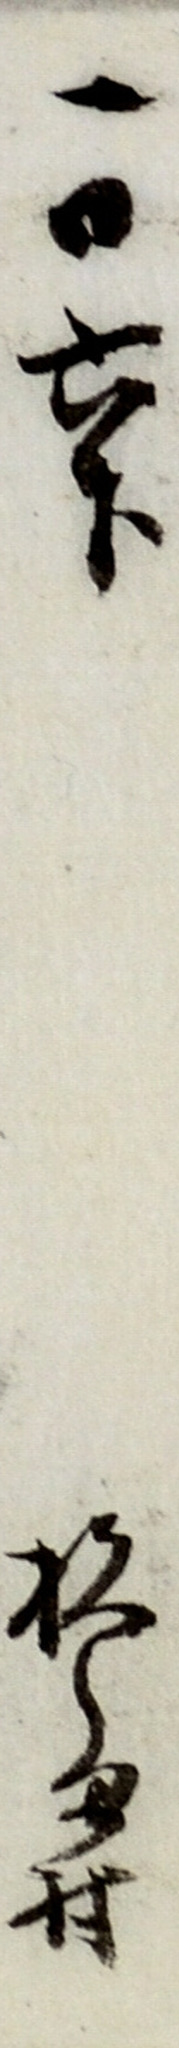一同六升杉島村
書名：御立山控
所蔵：伊那市立高遠町図書館・合同会社AMANE
